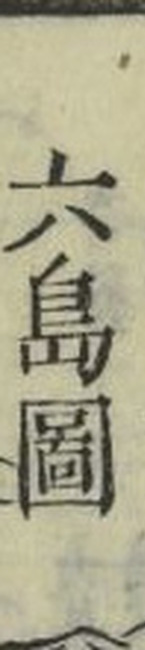六島図
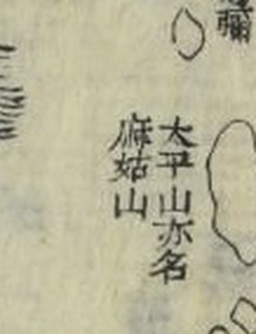麻姑山
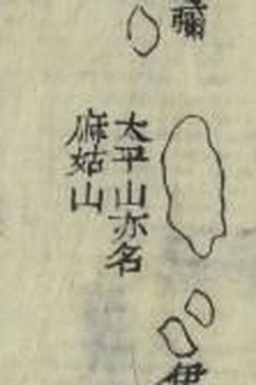太平山亦名
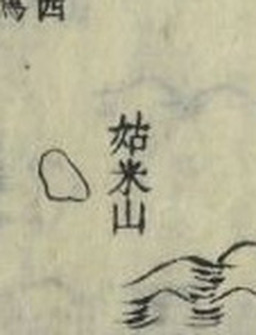姑米山
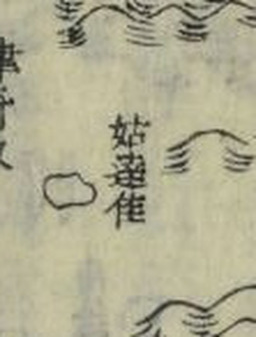姑達隹
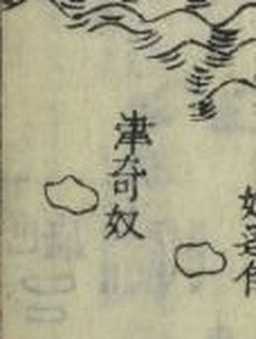津奇奴

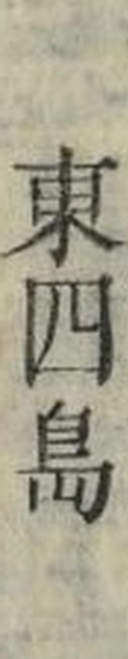東四島
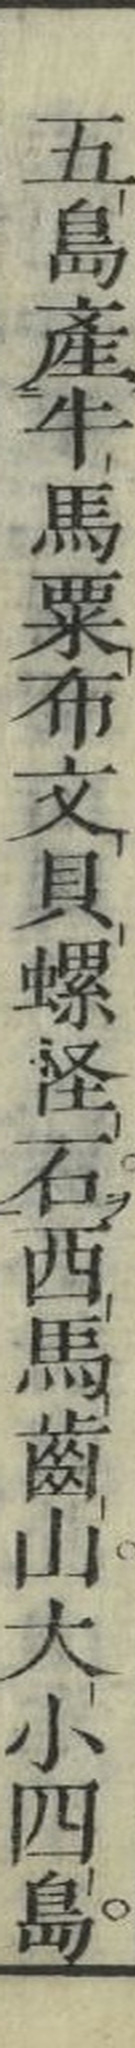五-島。産牛-馬粟-布文-貝-螺怪-石。西-馬-歯-山。大-小四-島。
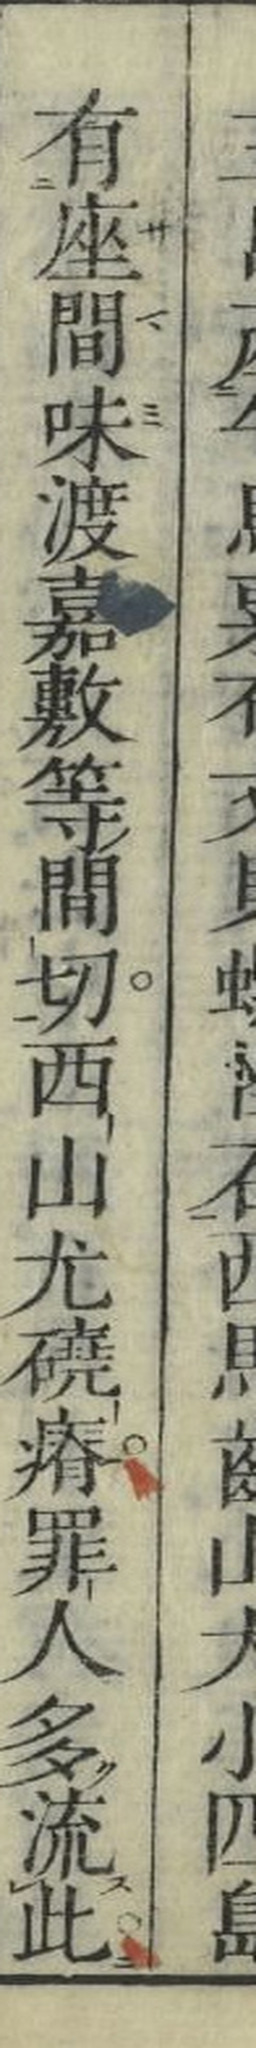有座間味渡嘉敷等間-切。西-山尤磽-瘠。罪-人多流此。

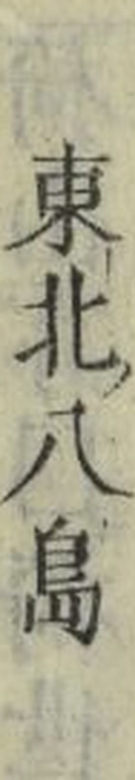東-北八-島

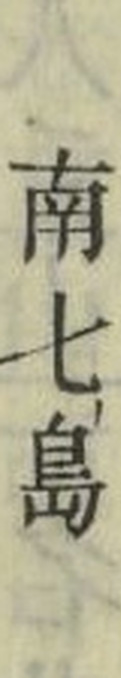南七-島
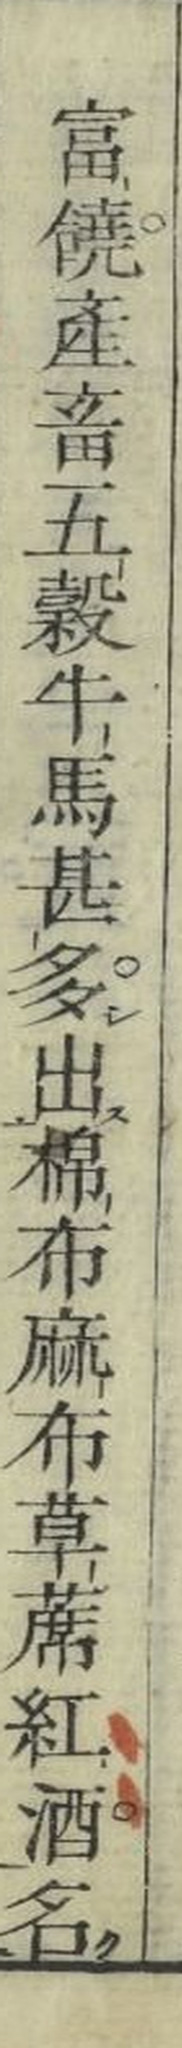富-饒。産畜五-穀牛-馬甚-多。出棉-布麻-布草-蓆紅-酒。名

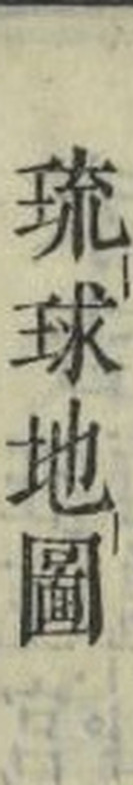琉-球地-図
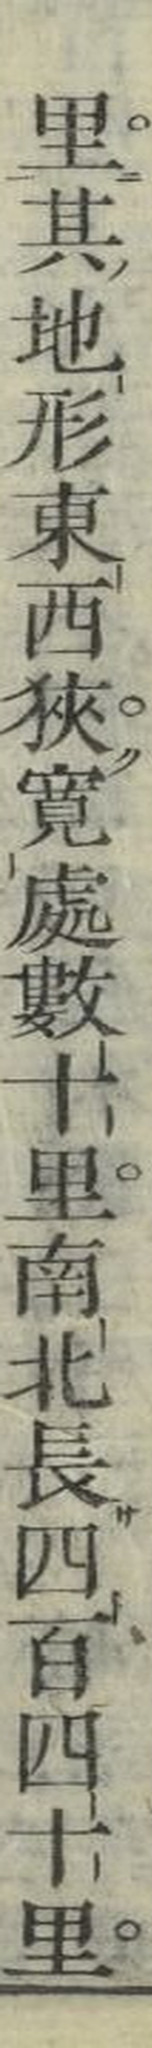里。其地-形東-西狭。寛-処数-十-里。南-北長四-百四-十-里。

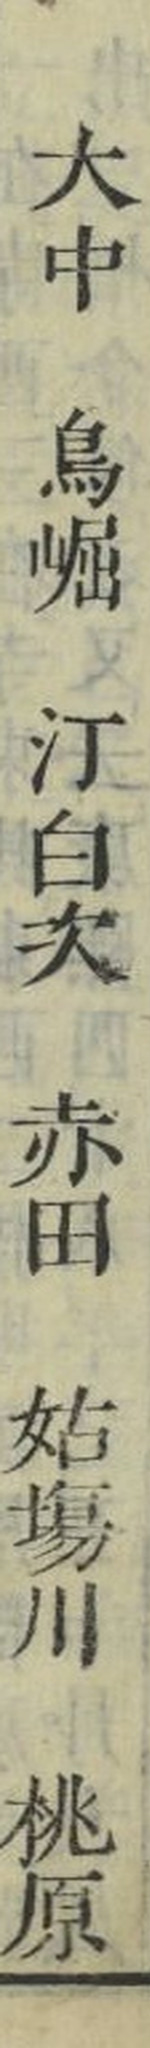大中鳥崛汀白次赤田姑場川桃原
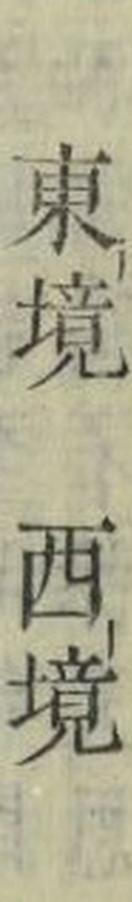東-境西-境
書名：中山伝信録 巻四
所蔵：University of the Ryukyus Library
